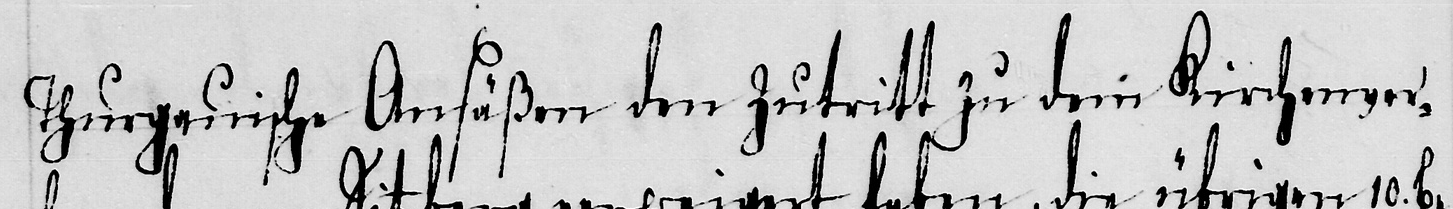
Thurgauische Ansäßen den Zutritt zu dem Kirchenver¬
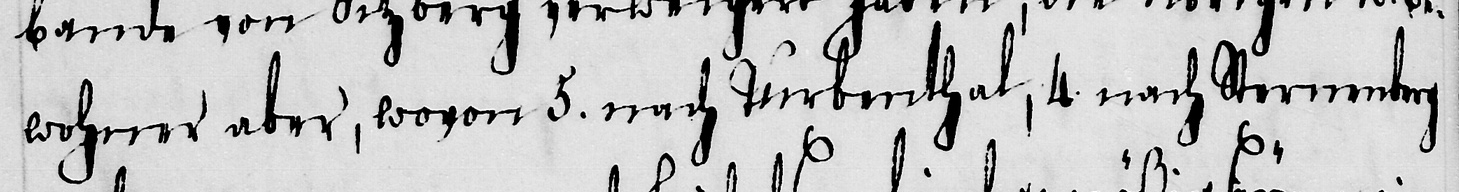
wohner aber, wovon 5. nach Turbenthal, 4. nach Sternenberg
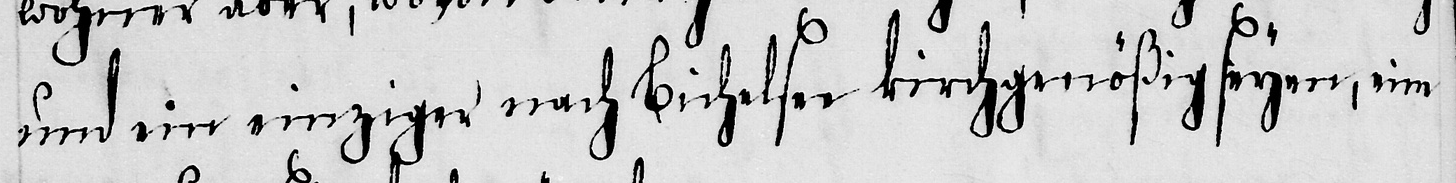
und ein einziger nach Bichelsee kirchgenößig seyen, eine
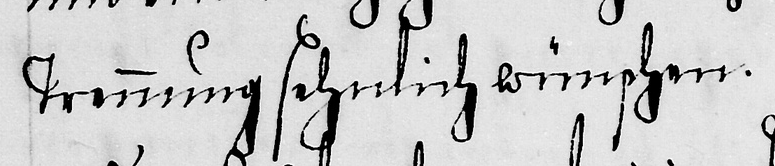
Trennung sehnlich wünschen.
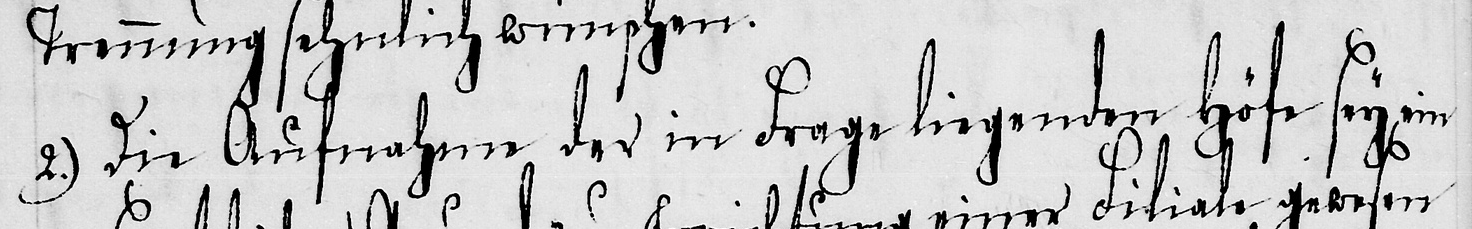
2.) Die Aufnahme der in Frage liegenden Höfe sey
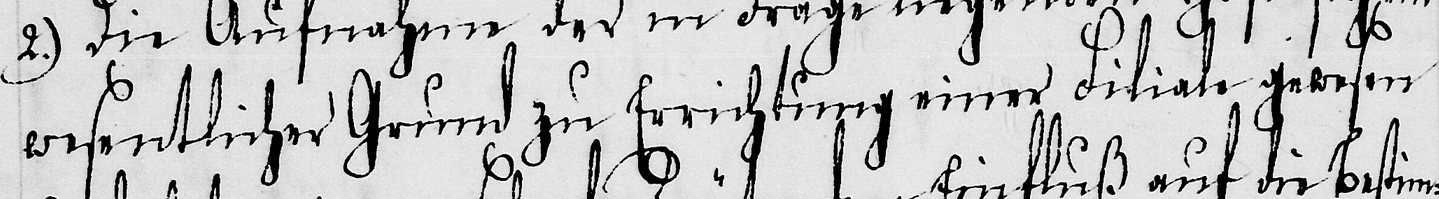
wesentlicher Grund zu Errichtung einer Filiale gewesen
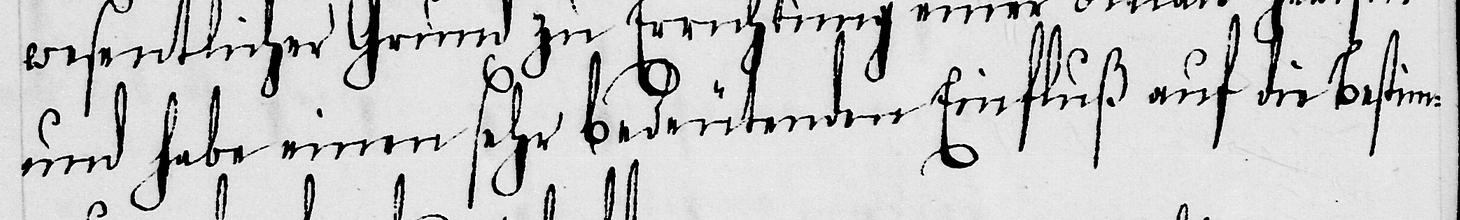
und habe einen sehr bedeutenden Einfluß auf die Besti¬
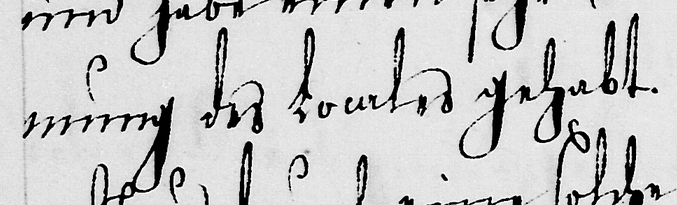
mmung des Locales gehabt.
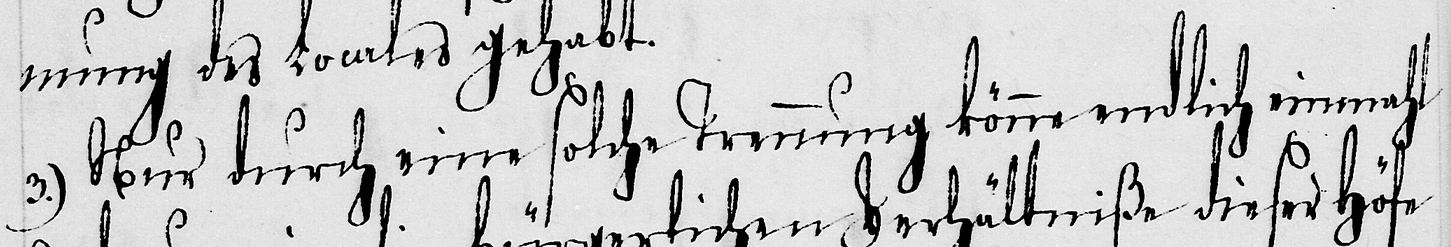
3.) Nur durch eine solche Trennung könne endlich einmahl
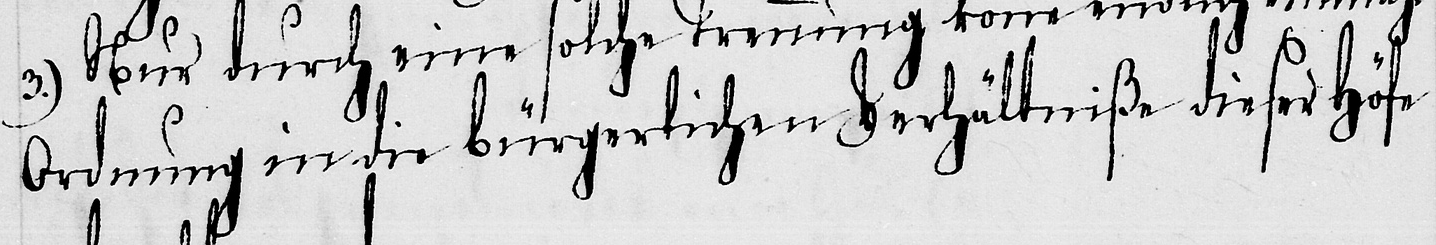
Ordnung in die bürgerlichen Verhältniße dieser Höfe
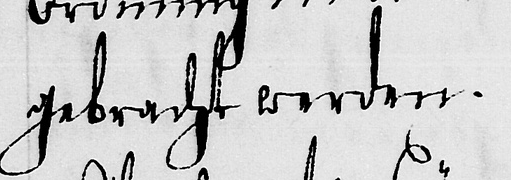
gebracht werden.
